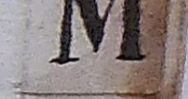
M
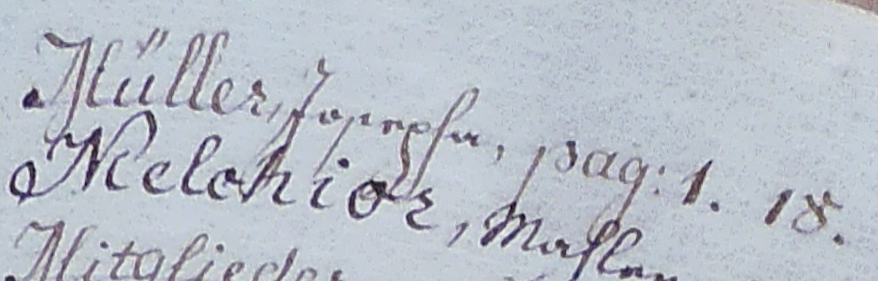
Müller, Josepha, pag: 1. 18.
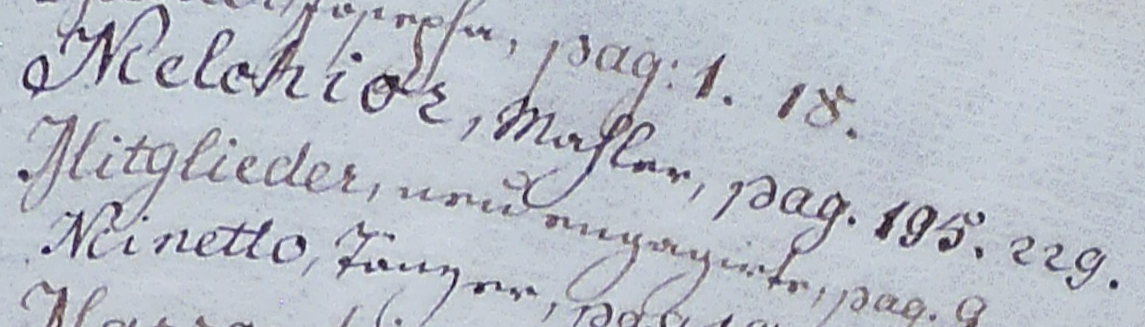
Melchior, Mahler, pag. 195. 229.
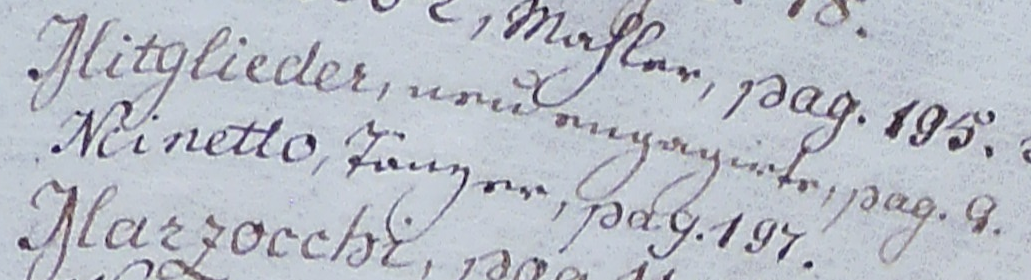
Mitglieder, neu engagirte, pag. 9.
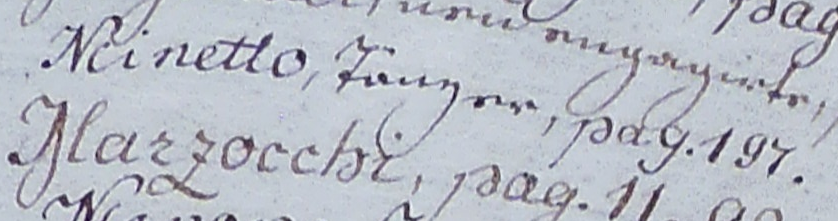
Minetto, Tänzer, pag. 197.
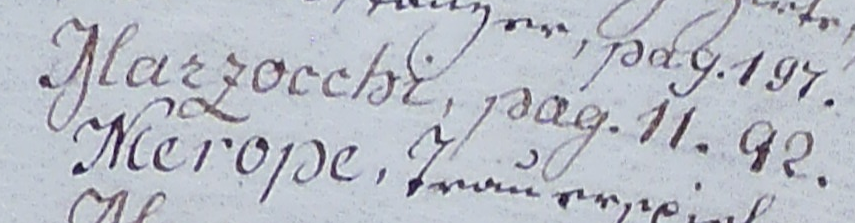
Marzocchi, pag. 11. 92.
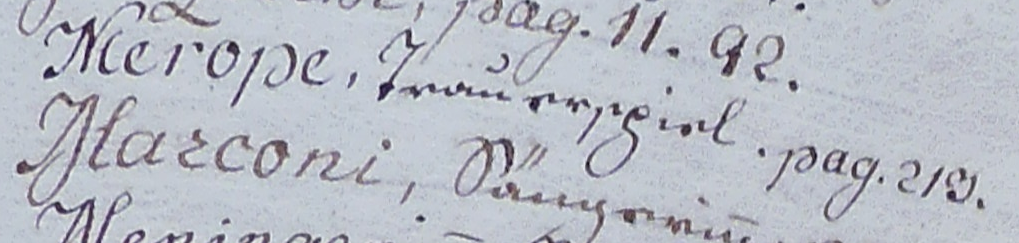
Merope, Trauerspiel. pag. 213.
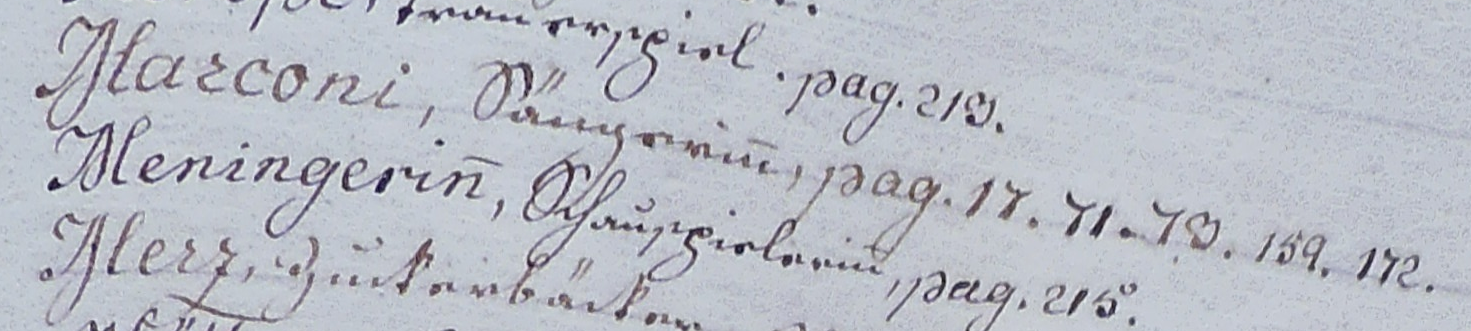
Marconi, Sängerin̅, pag. 17. 71. 73. 159. 172.
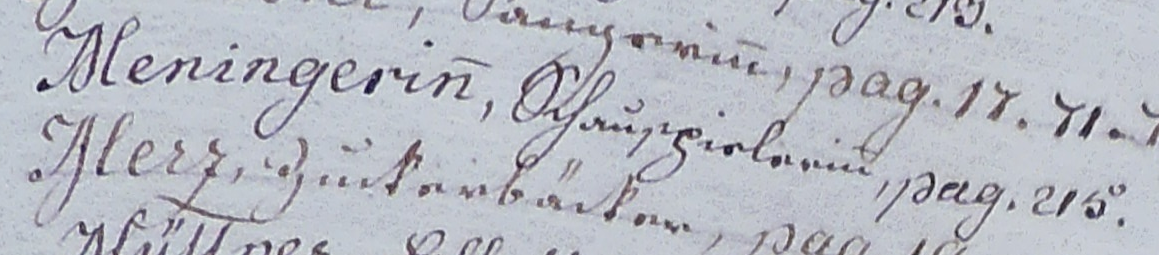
Meningerin̅, Schauspielerin̅, pag. 215.
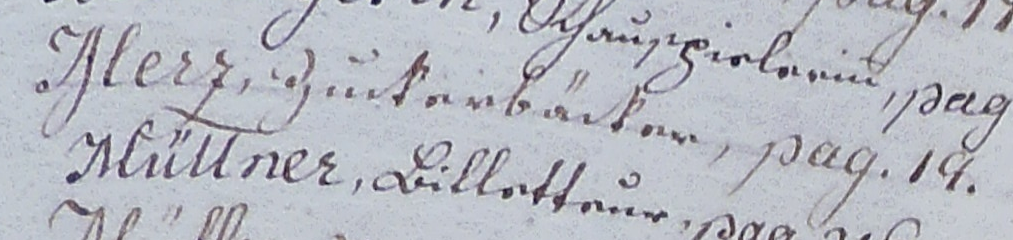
Merz, Zuckerbäcker, pag. 14.
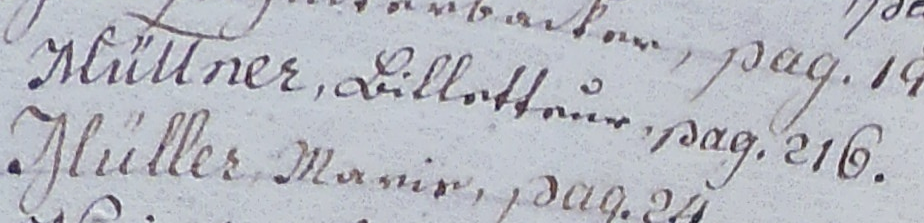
Müllner, Billetteur. pag. 216.
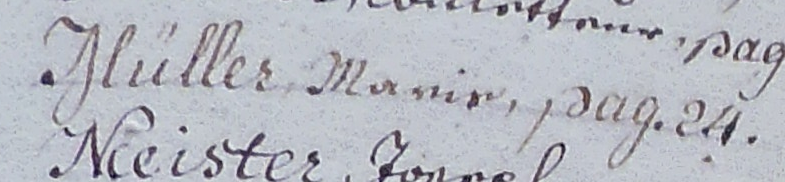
Müller Marie, pag. 24.
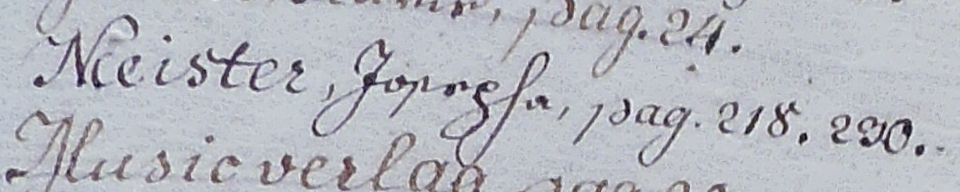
Meister, Josepha, pag. 218. 230.
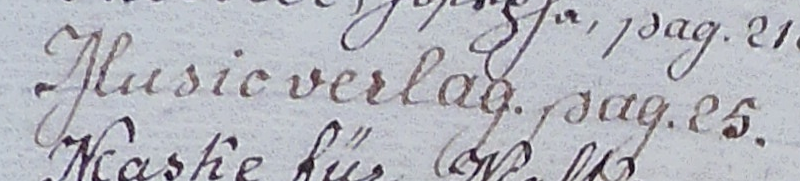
Musicverlag. pag. 25.
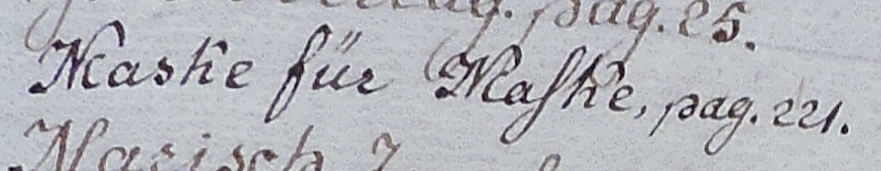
Maske für Maske, pag. 221.
